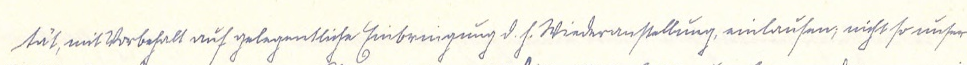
tät, mit Vorbehalt auf gelegentliche Einbringung d. h. Wiederanstellung, einlaufen; nicht so unser
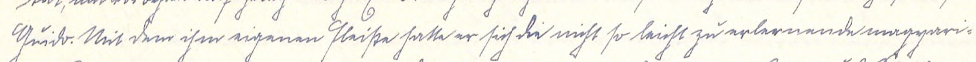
Guido. Mit dem ihm eigenen Fleiße hatte er sich die nicht so leicht zu erlernende ungari-
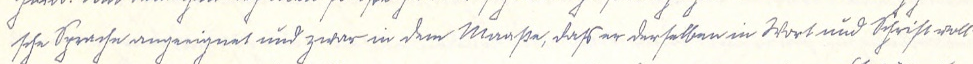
sche Sprache angeeignet und zwar in dem Maaße, dass er derselben in Wort und Schrift voll-
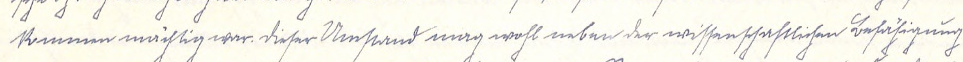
kommen mächtig war. Dieser Umstand mag wohl neben der wissenschaftlichen Befähigung
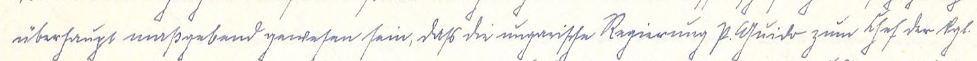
überhaupt maßgebend gewesen sein, dass die ungarische Regierung P. Guido zum Cherf der kgl.
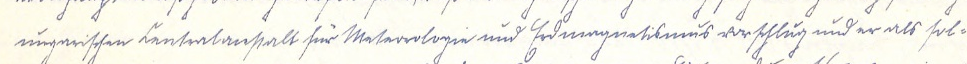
ungarischen Centralanstalt für Meteorologie und Erdmagnetismus vorschlug und er als sol-
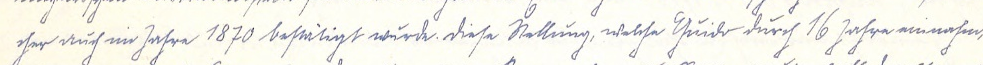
cher auch im Jahre 1870 bestätigt wurde. Diese Stellung, welche Guido durch 16 Jahre einnahm
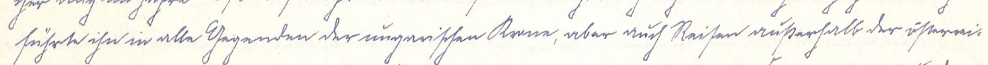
führte ihn in alle Gegenden der ungarischen Kron, aber auch Reisen außerhalb der österrei-
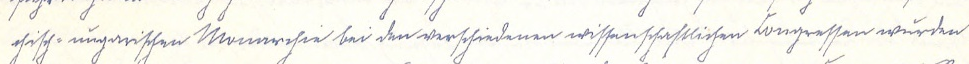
chisch-ungarischen Monarchie bei den verschiedenen wissenschaftlichen Congressen wurden
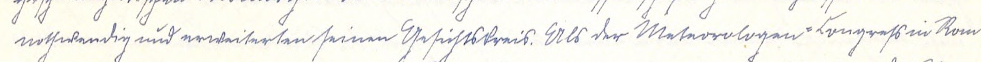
nothwendig und erweiterten seinen Gesichtskreis. Als der Meteorologen-Congess in Rom
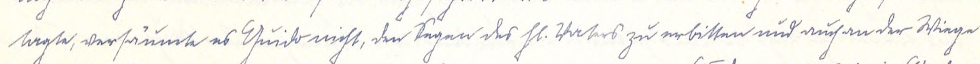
tagte, versäumte es Guido nicht, den Segen des hl. Vaters zu eribtten und auch an der Wiege
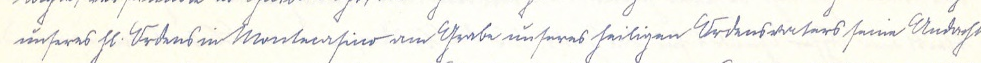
unseres hl. Ordens in MOntecasino am Grabe unseres heiligen Ordensvaters seine Andacht
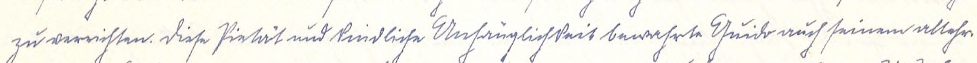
zu verrichten. Diese Pietät und kindliche Anhänglichkeit bewahrte Guido auch seinem allehr-
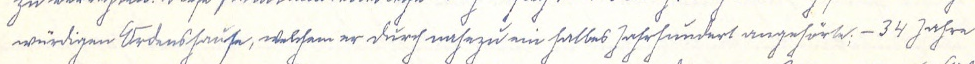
würdigen Ordenshause, welchen er durch nahezu ein halbes Jahrhundert angehörte; - 34 Jahre
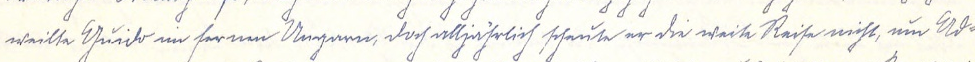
weilte Guido im fernen Ungarn, doch alljährlich scheute er die weite Reise nicht, um Ad-
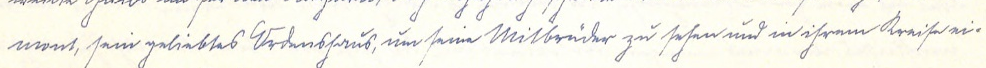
mont, sein geliebtes Ordenshaus, um seine Mitbrüder zu sehen und in ihrem Kreise ei-
